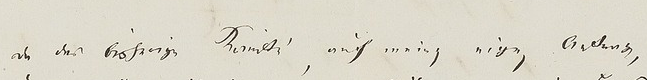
Da das bisherige Komité, auf meinen eignen Antrag,
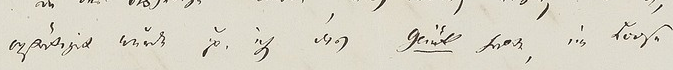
bestätigt wurde &. ich das Glück hatte, im Loose
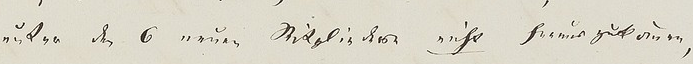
unter den 6 neuen Mitgliedern nicht herauszukommen,
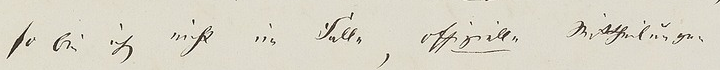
so bin ich nicht im Falle, offizielle Mittheilungen
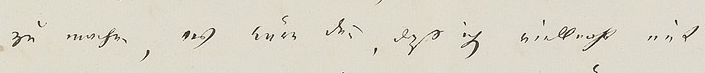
zu machen, es wäre denn, daß ich vielleicht mit
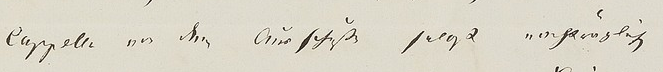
Appelle vor dem Ausschuße selbst nachträglich
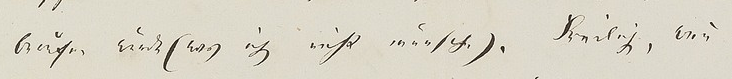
berufen würde (was ich nicht wünsche). Freilich, wenn
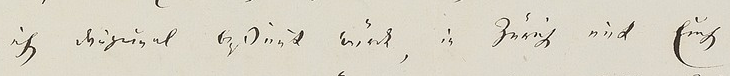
ich dannzumal bestimmt würde, in Zürich mit Euch
